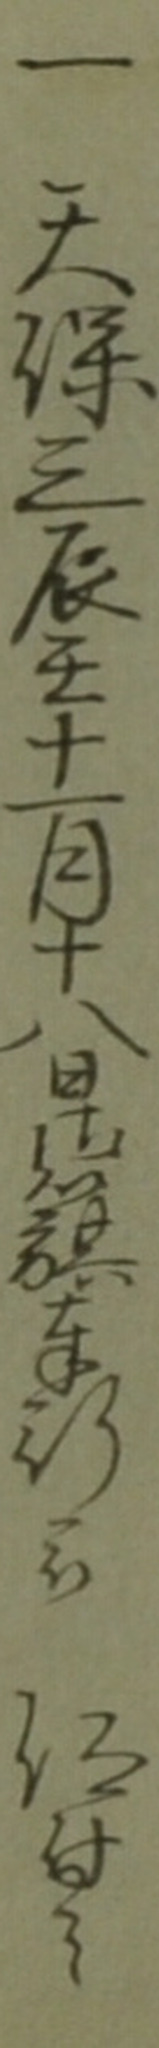一同天保三辰閏十一月十八日御籏奉行被仰付之
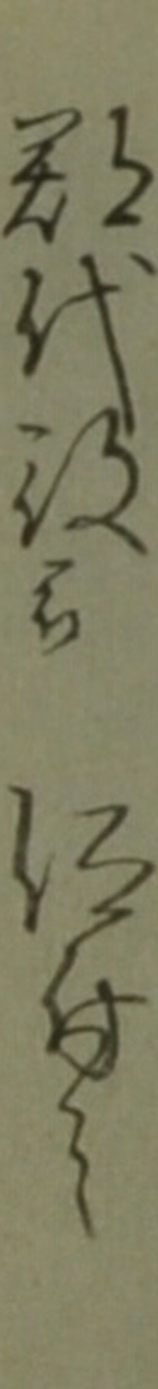郡代役被仰付之
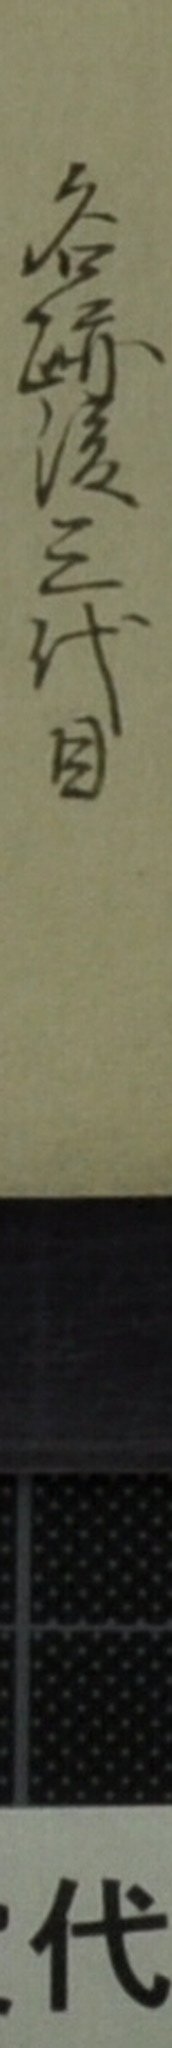名跡後三代目
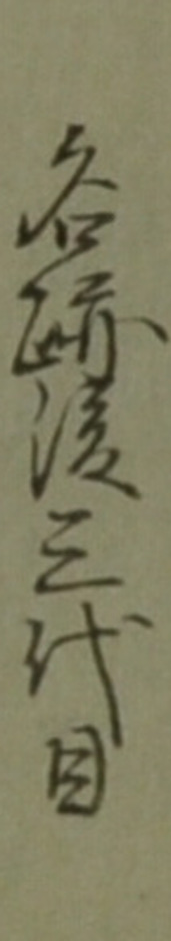名跡後三代目
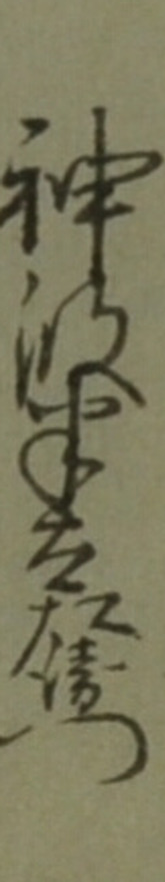神波半左衛門
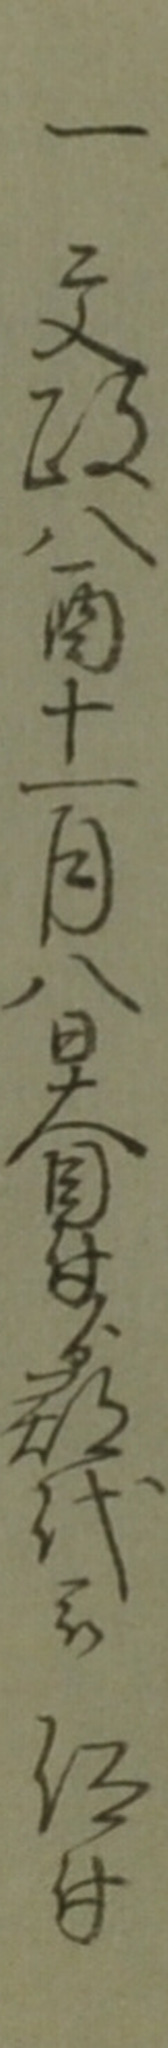一文政八酉十一月八日大目付ゟ郡代被仰付
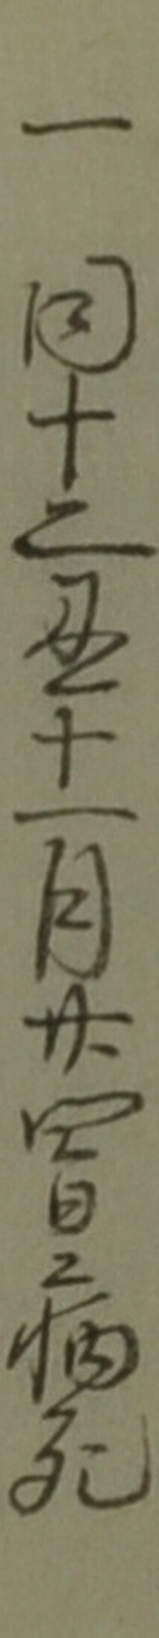一同十二丑十一月廿四日病死
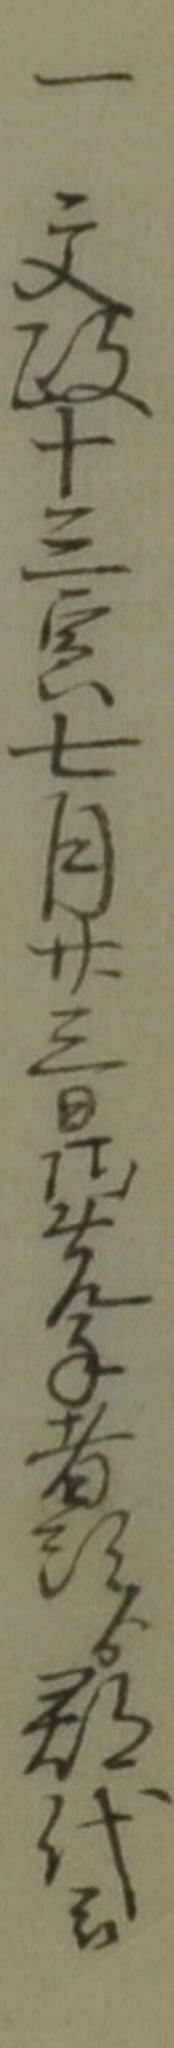一文政十三寅七月廿三日御先手者頭ゟ郡代被
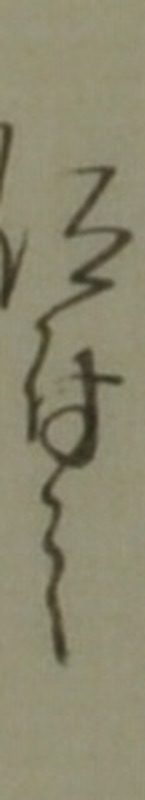仰付之
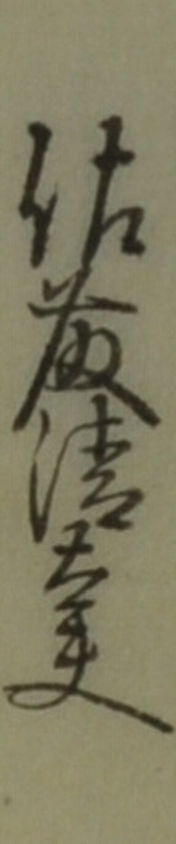佐藤清太夫
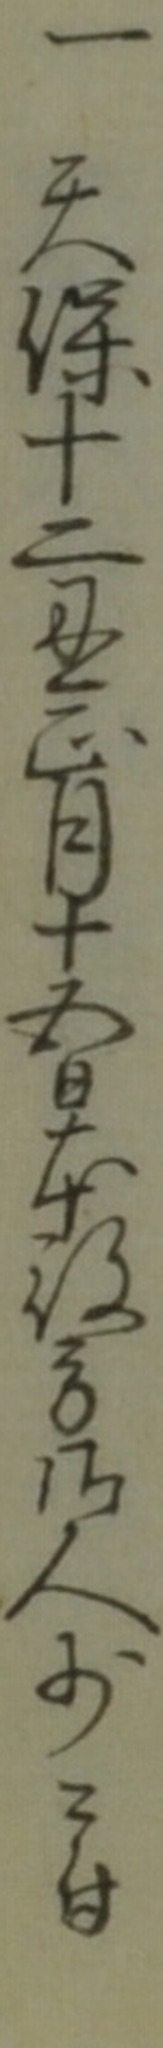一天保十二丑正月十五日本役方御人少ニ付
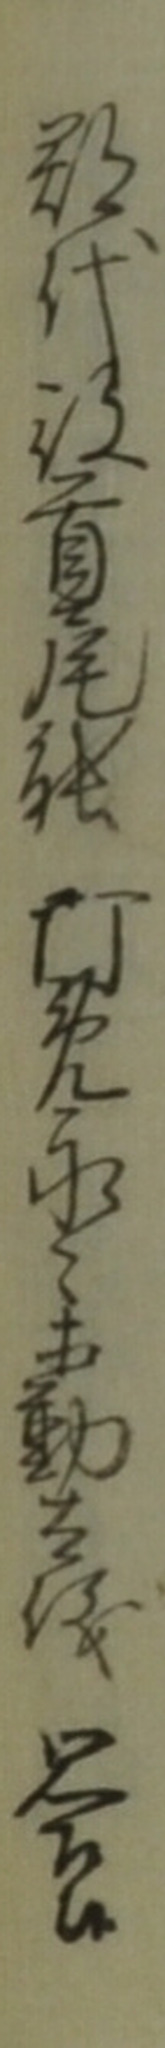郡代役首尾能御免永之相勤太儀思召候
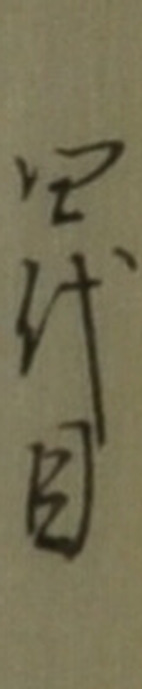四代目
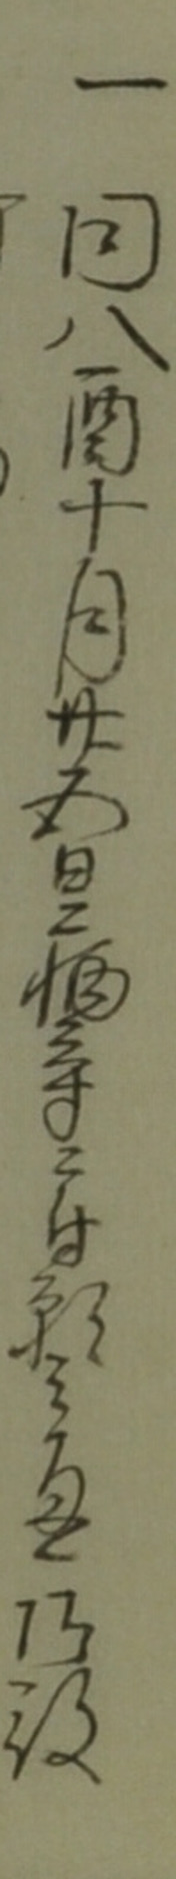一同八酉十月廿五日病気ニ付願之通御役
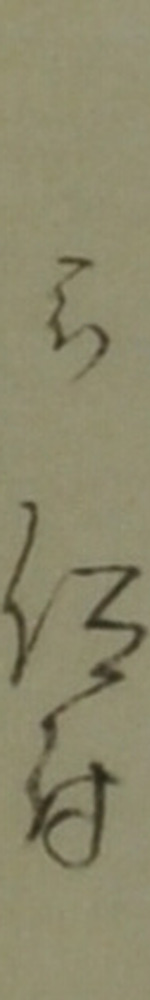被仰付
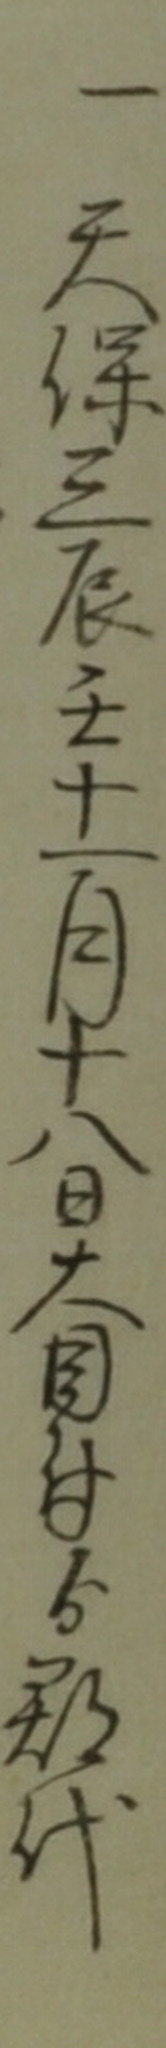一天保三辰閏十一月十八日大目付ゟ郡代
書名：諸御役代々録（二）
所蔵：伊那市立高遠町図書館・合同会社AMANE
